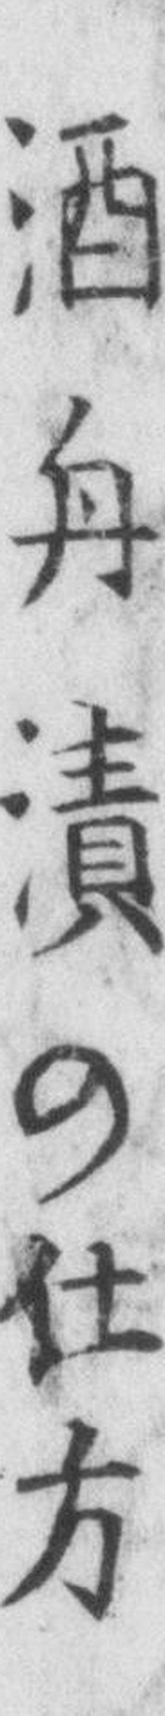酒舟漬の仕方
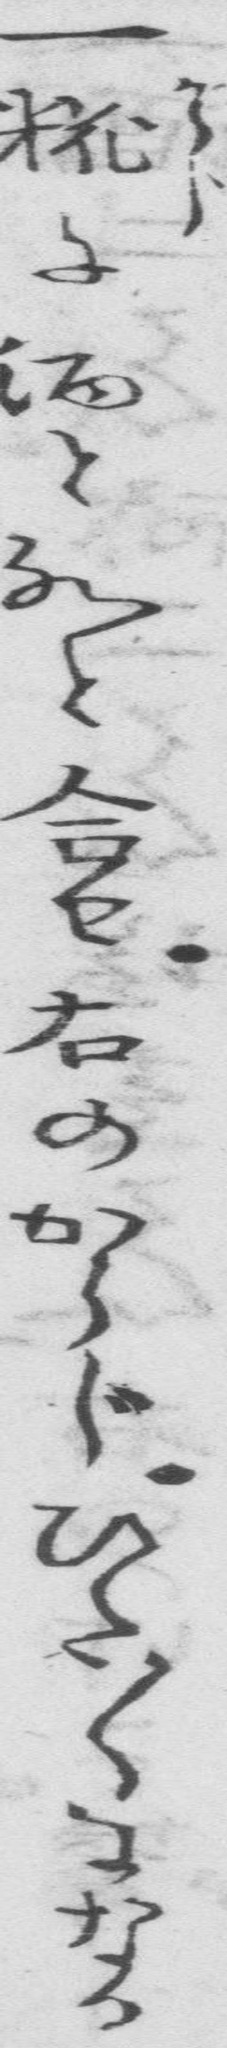一糀に酒と水と合せ。右のかうじ。ひた〳〵になる
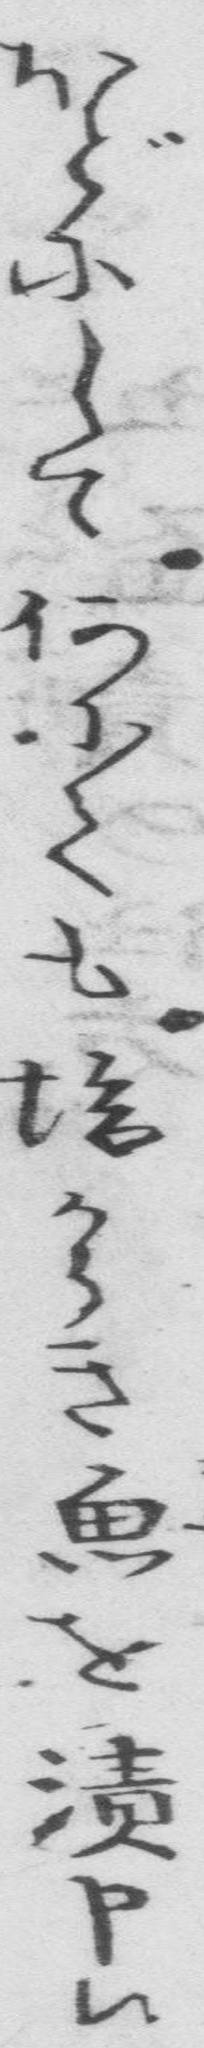ほどにして。何にても。塩からき魚を漬申候

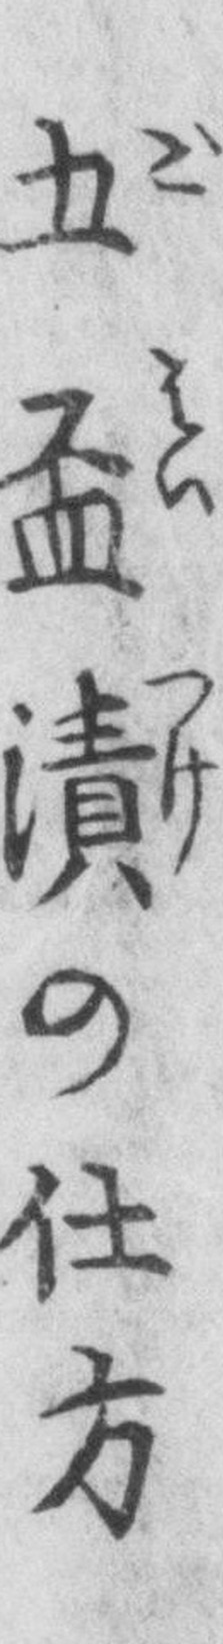五盃漬の仕方
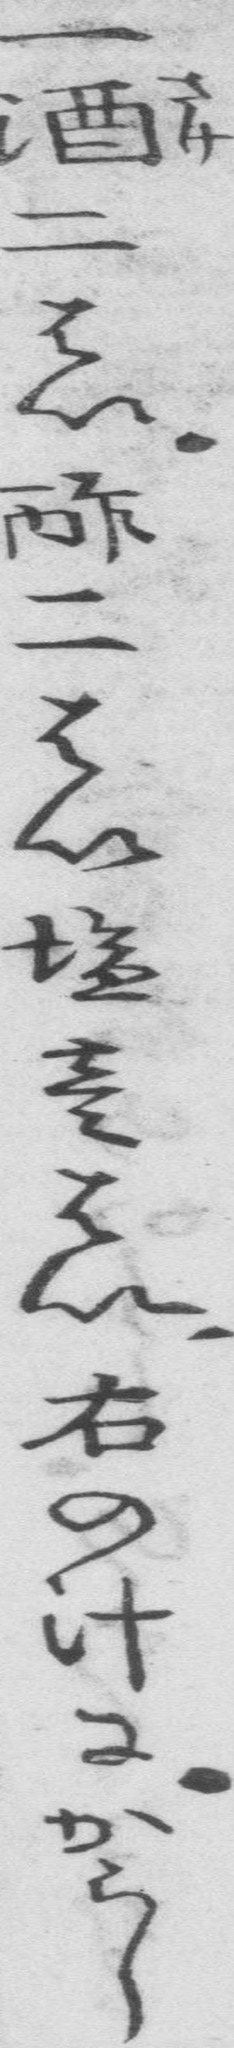一酒二はい。酢二はい塩壱はい。右の汁に。からし
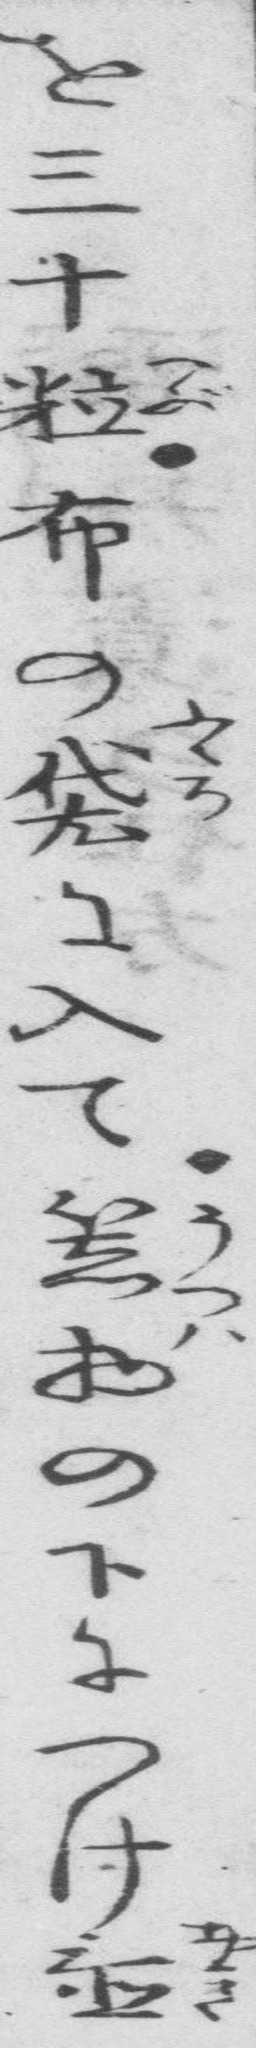を三十粒。布の袋に入て。器物の下につけ置
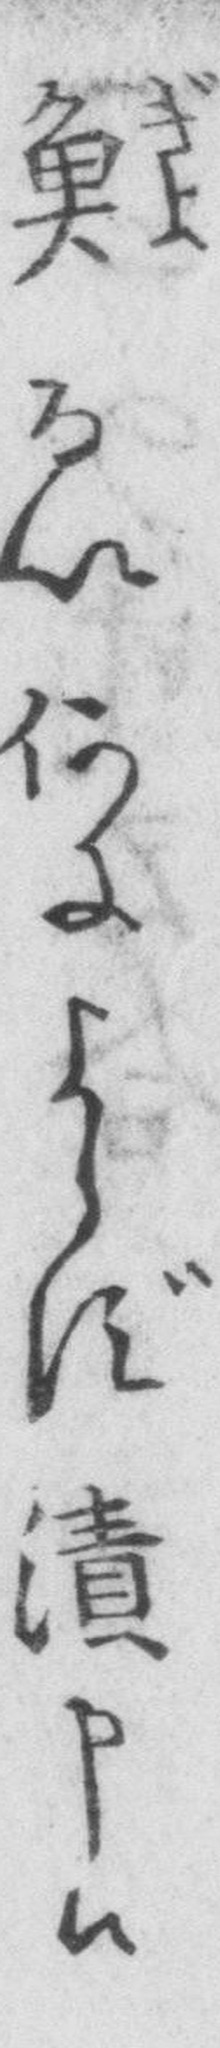魚るい何によらず漬申候
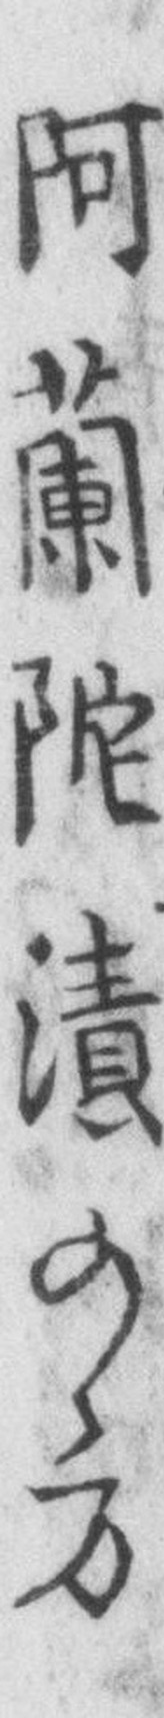阿蘭陀漬の方
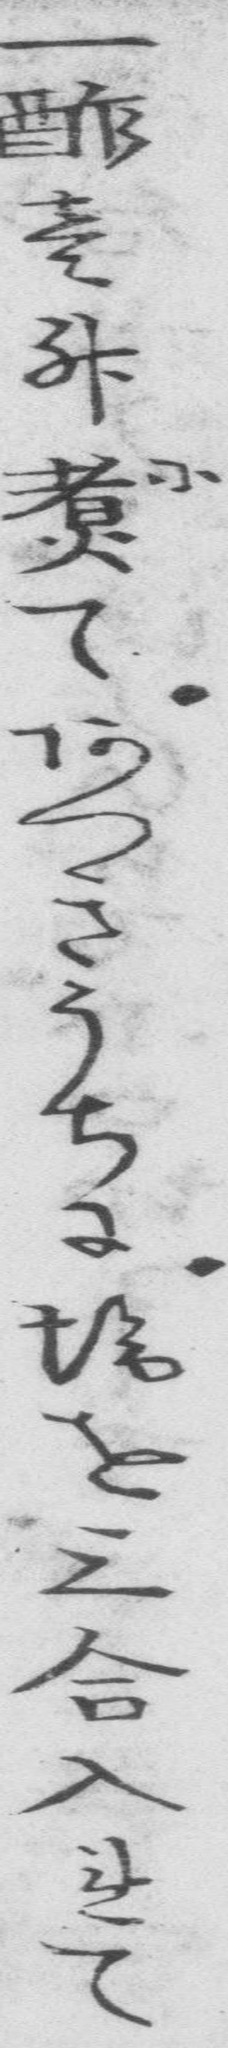一酢壱升煮て、あつきうちに。塩を三合入れて
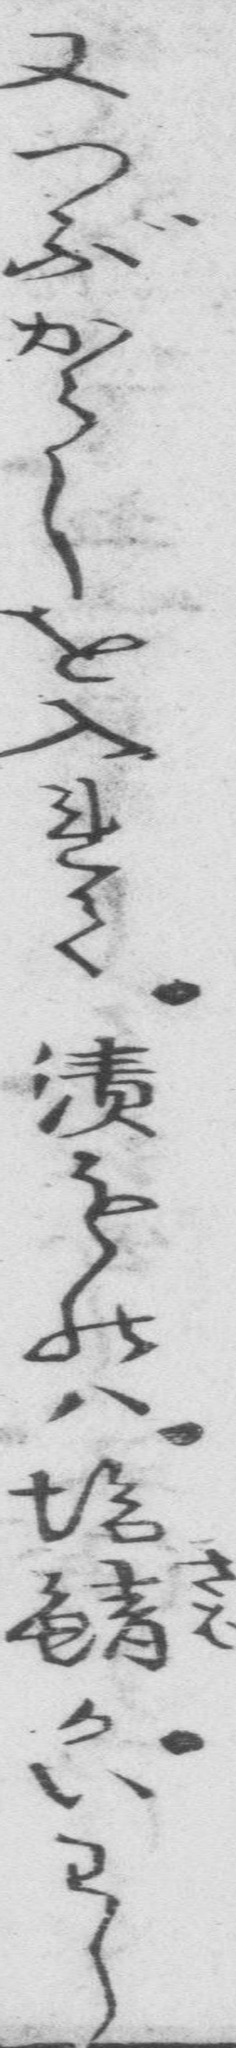又つぶからしを入れて。漬ものは。塩鯖か。いわし
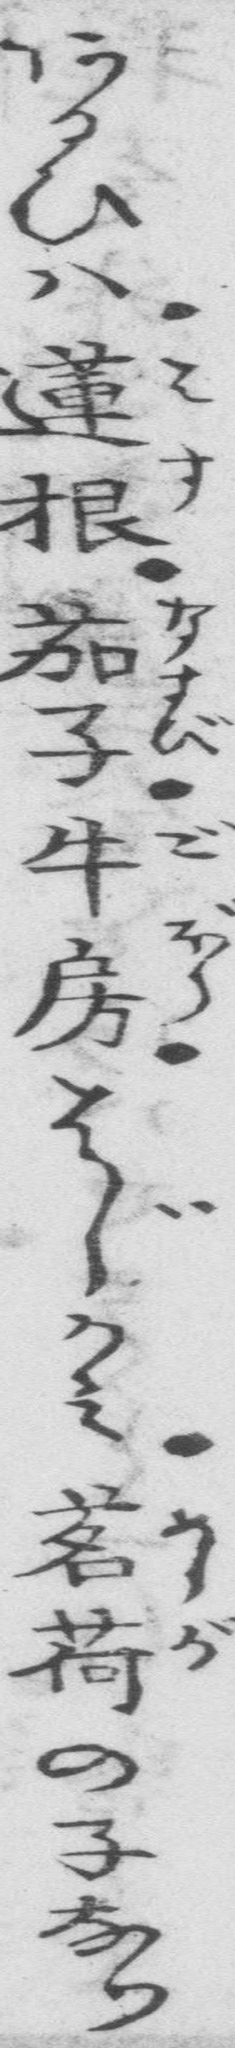あるひは。蓮根。茄子。牛房。はじかみ。茗荷の子なり
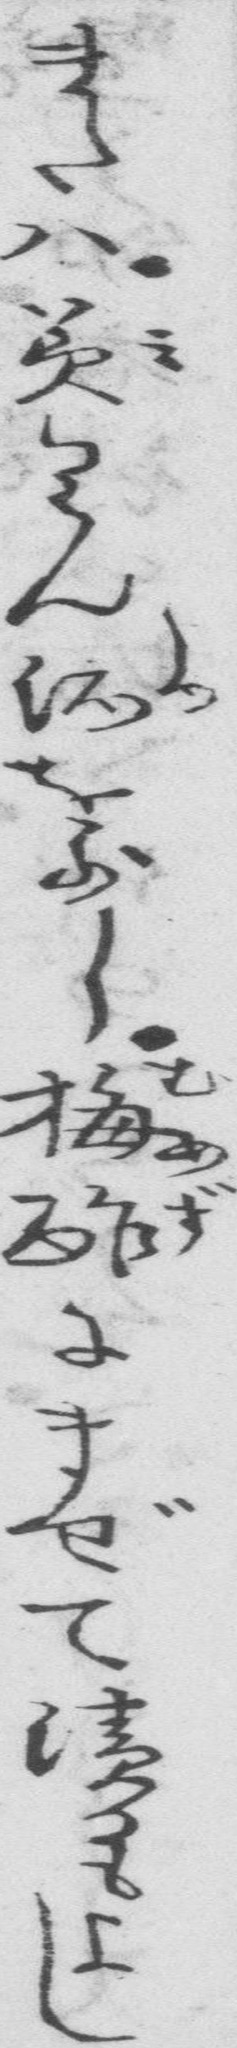または。美りん酒を少し。梅酢にまぜて漬るもよし
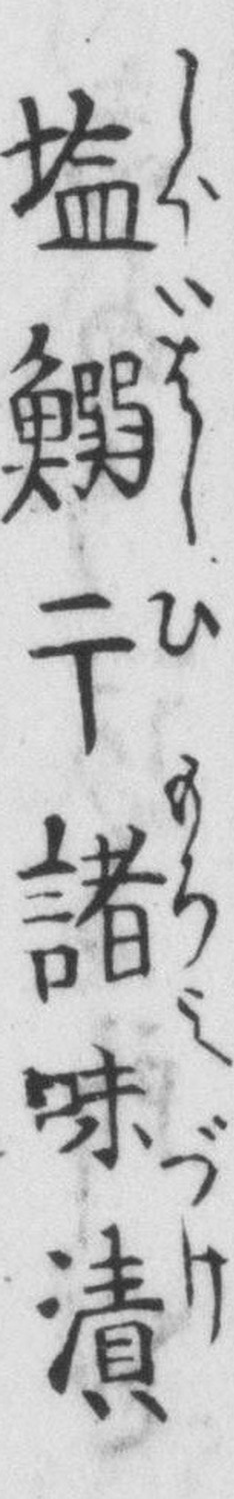塩鰯干諸味漬
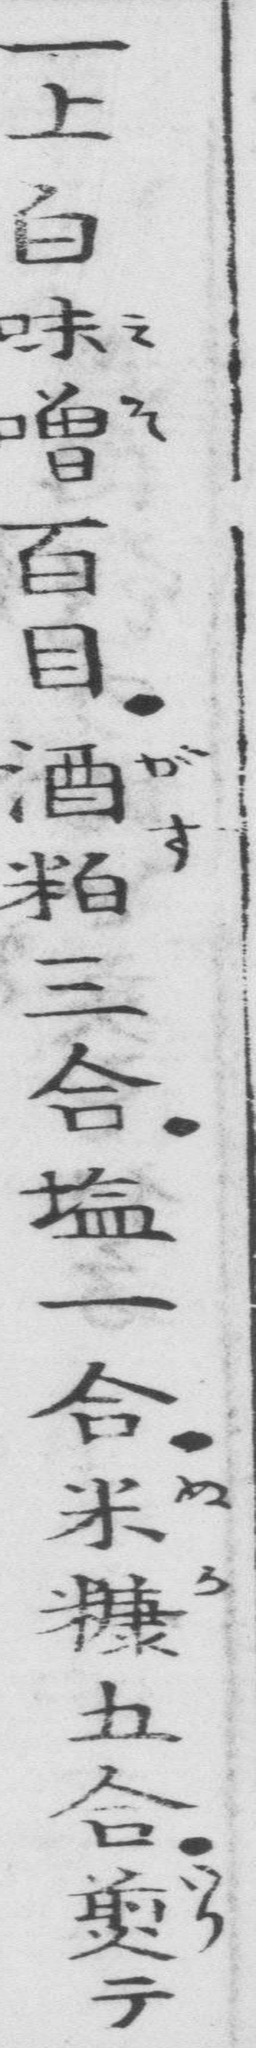一上白味噌百目。酒粕三合。塩一合。米糠五合。煎て
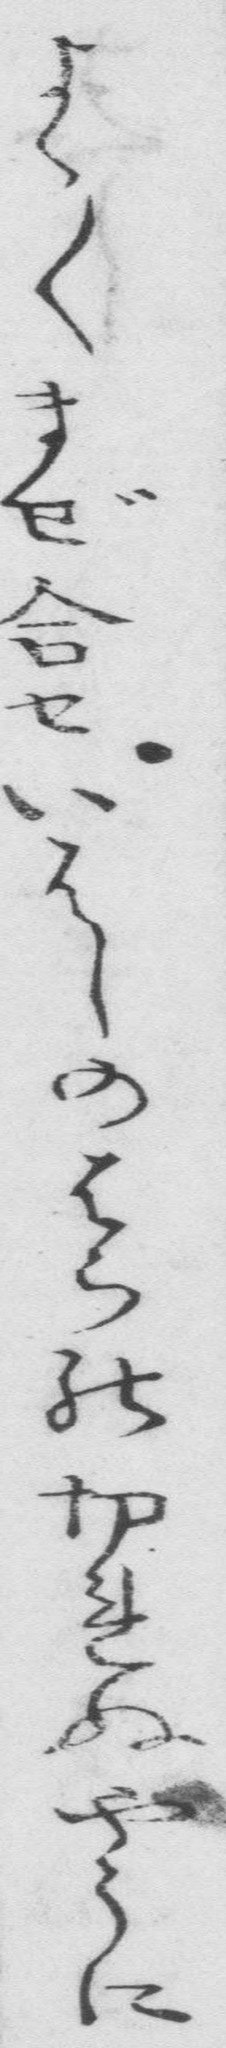よく〳〵まぜ合せ。いはしのはらの切れぬやうに
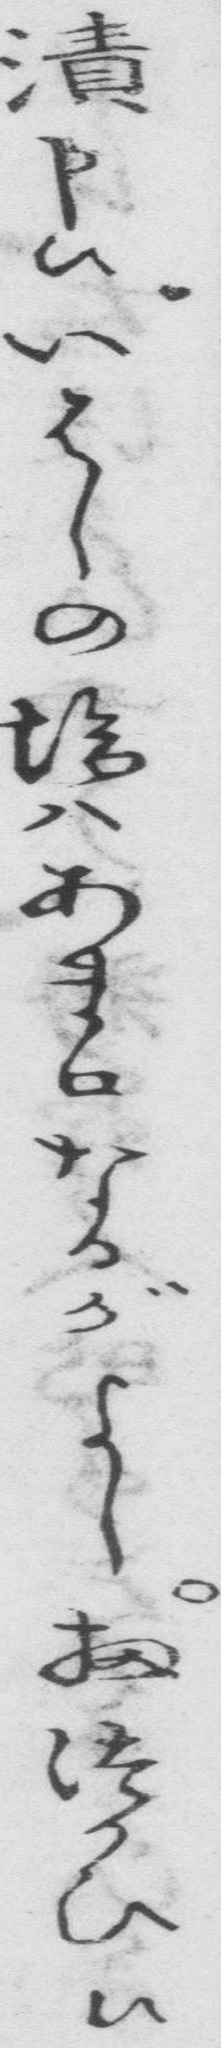漬申候。いはしの塩はあま口なるがよし。扨つかひ候
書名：萬寳料理秘密箱
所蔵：大阪府立大学学術情報センター 国文学研究資料館
